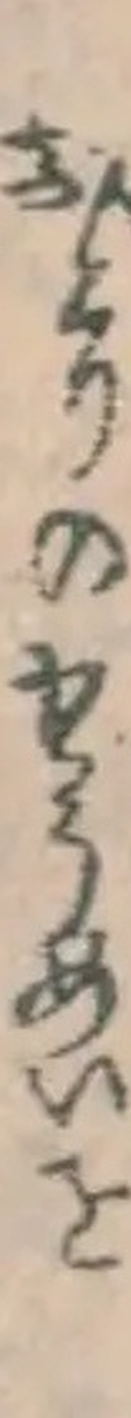おどりのせうめいを
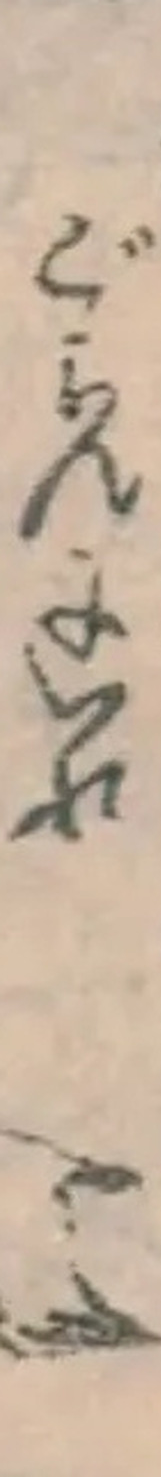ごらんにいれ
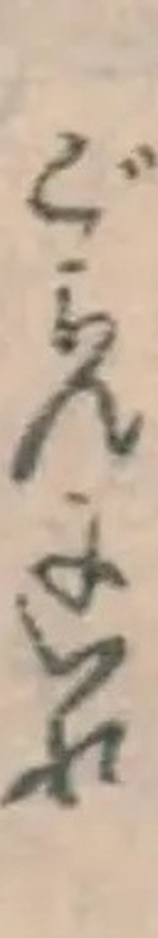ごらんにいれ
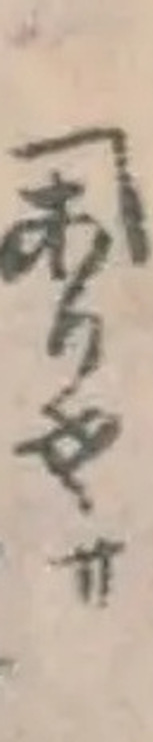〽ありやさ
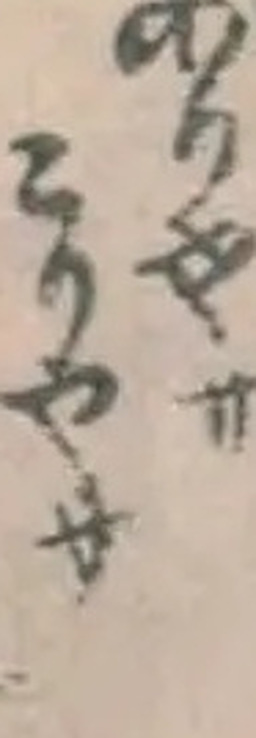こりやさ
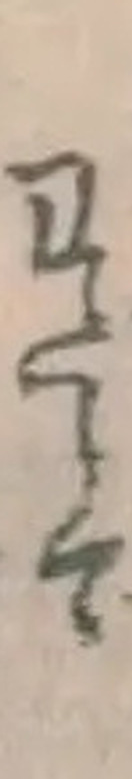わたしで
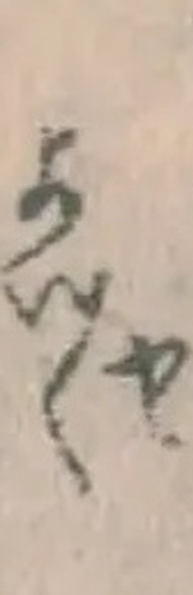よい〳〵
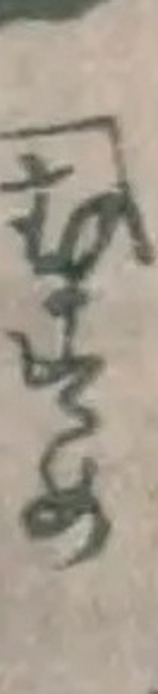〽むすめ
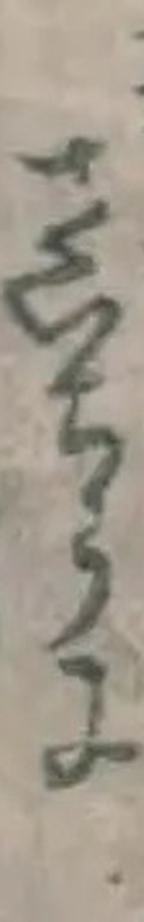さいちうに
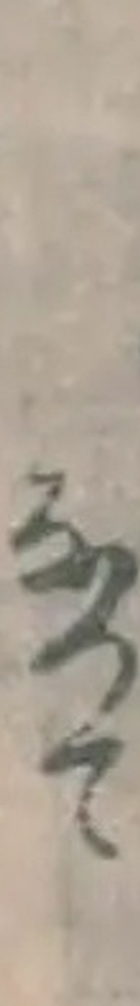なつて
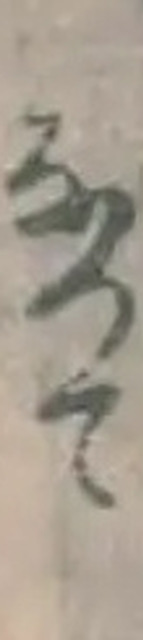なつて
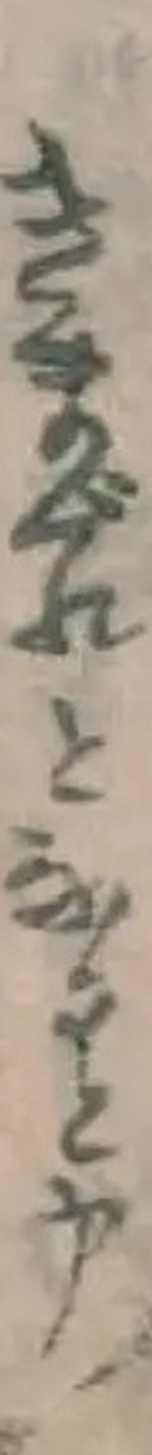きまぐれとなると申
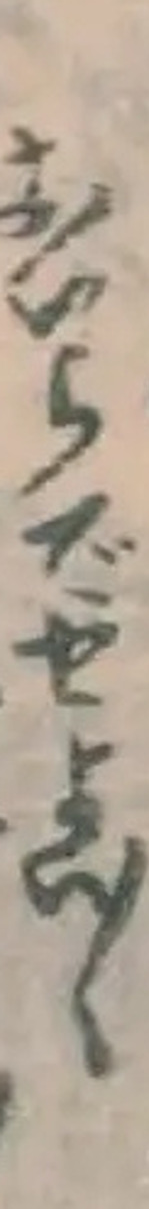おいらでせ？よい〳〵
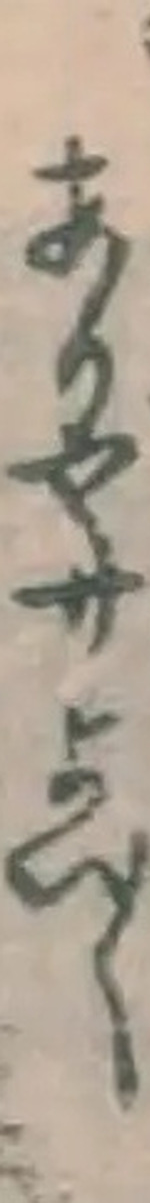ありやさよい〳〵
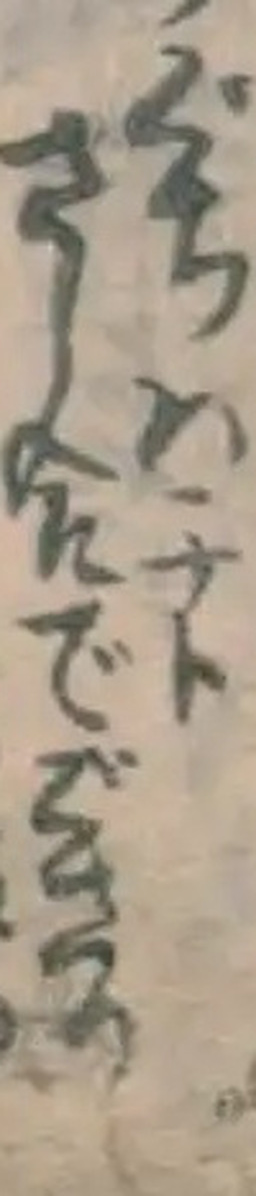さし合でござり

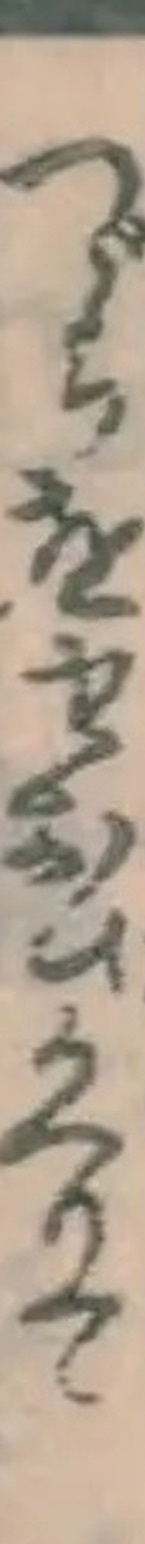つゞらをせおひかへりて
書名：舌切雀
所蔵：国立国会図書館 National Diet Library, JAPAN
